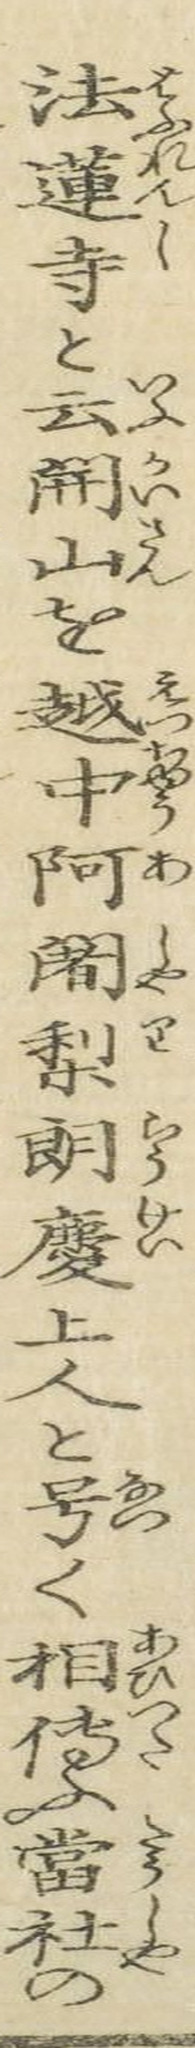法蓮寺と云開山を越中阿闍梨朗慶上人と号く相傳ふ當社の
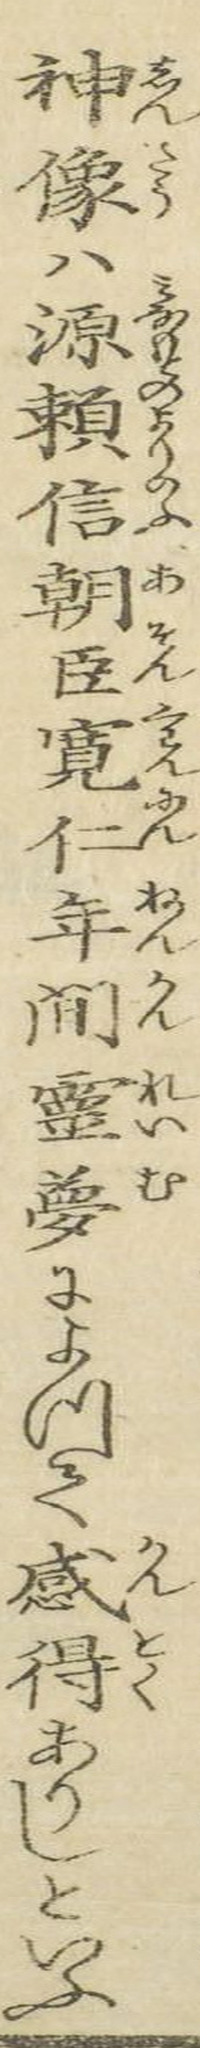神像は源頼信朝臣寛仁年間靈夢によつて感得ありしといふ
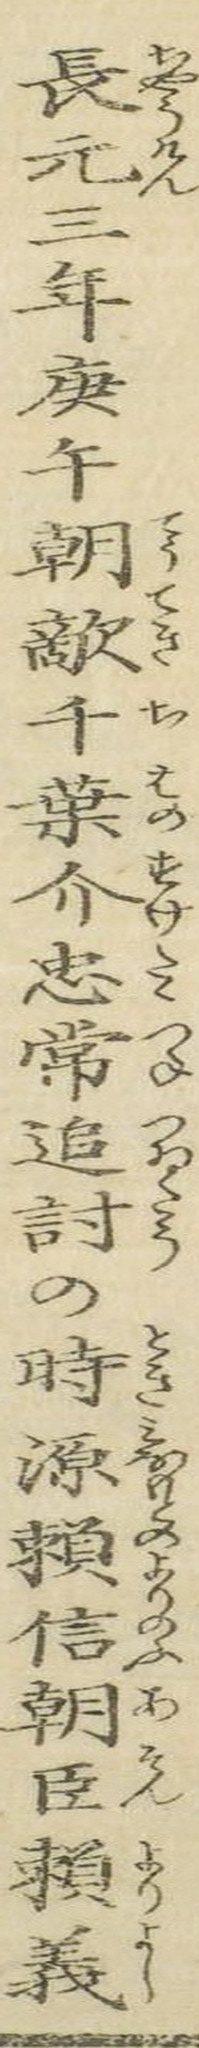長元三年庚午朝歒千葉介忠常追討の時源頼信朝臣頼義
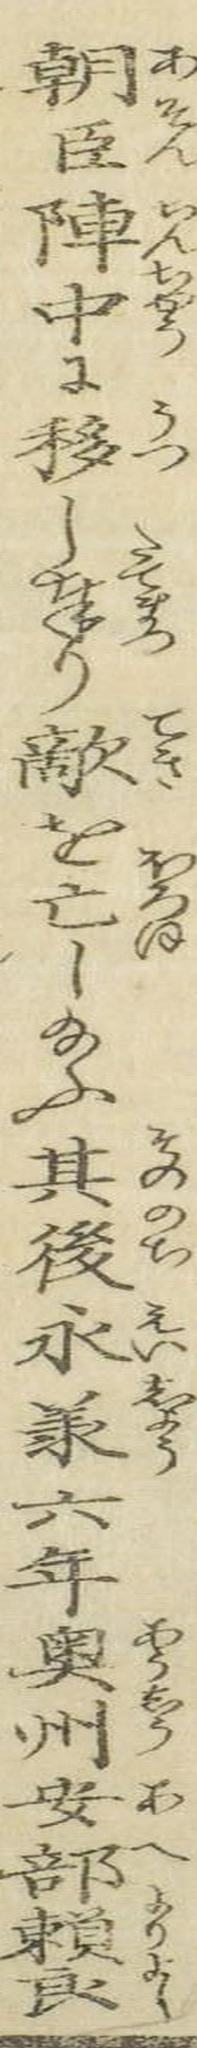朝臣陣中に移し奉り歒を亡し給ふ其後永承六年奥州安部頼良
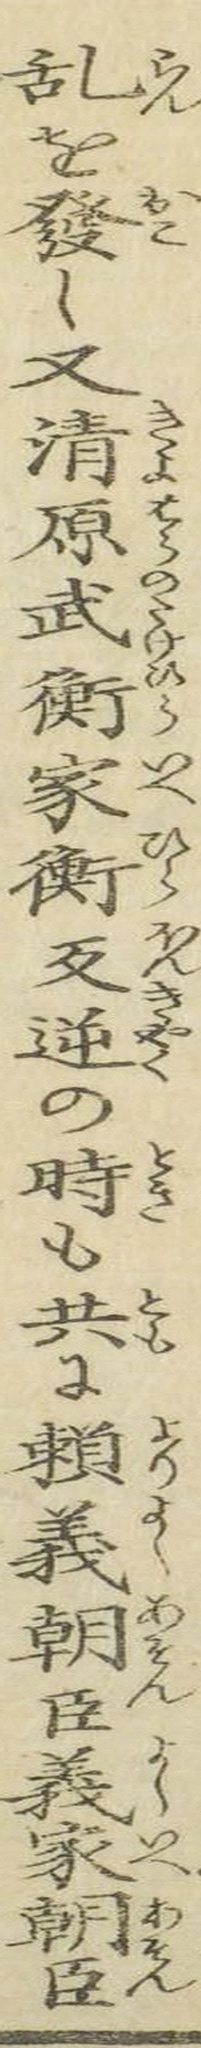乱を發し又清原武衡家衡反逆の時も共に頼義朝臣義家朝臣
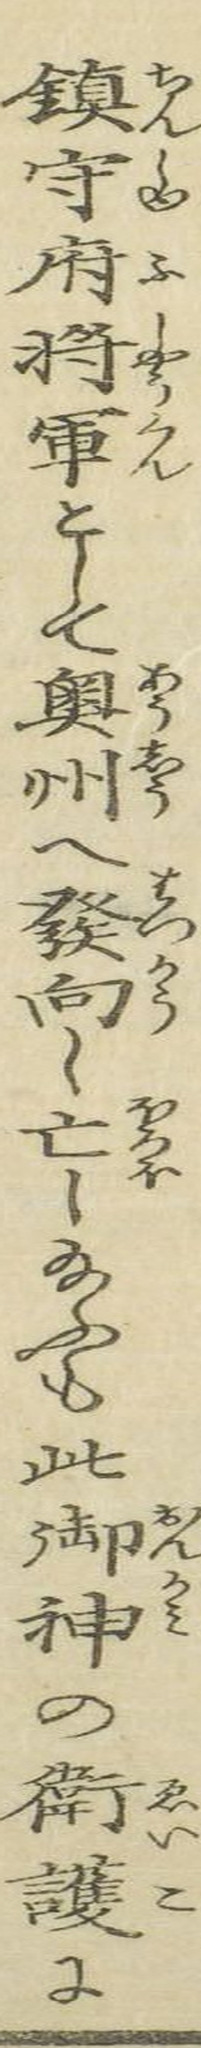鎮守府将軍として奥州へ發向し亡し給ふも此御神の衛護に
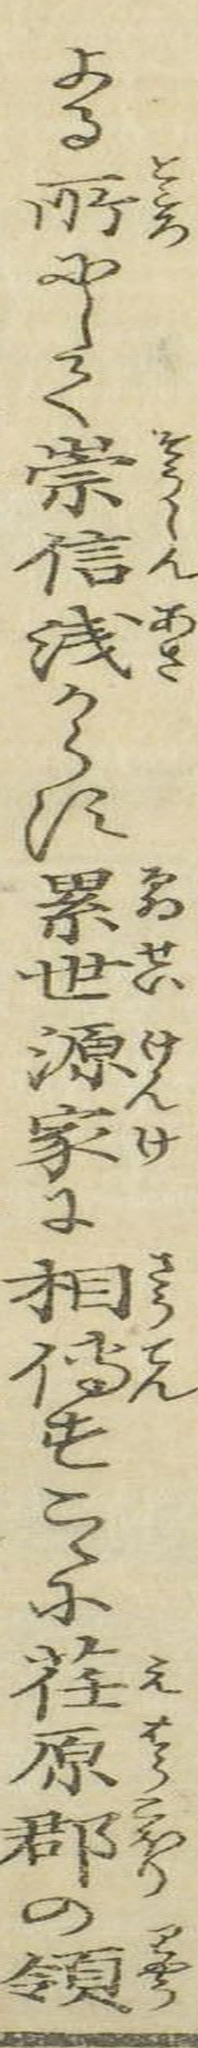よる所にして崇信浅からす累世源家に相傳すこゝに荏原郡の領
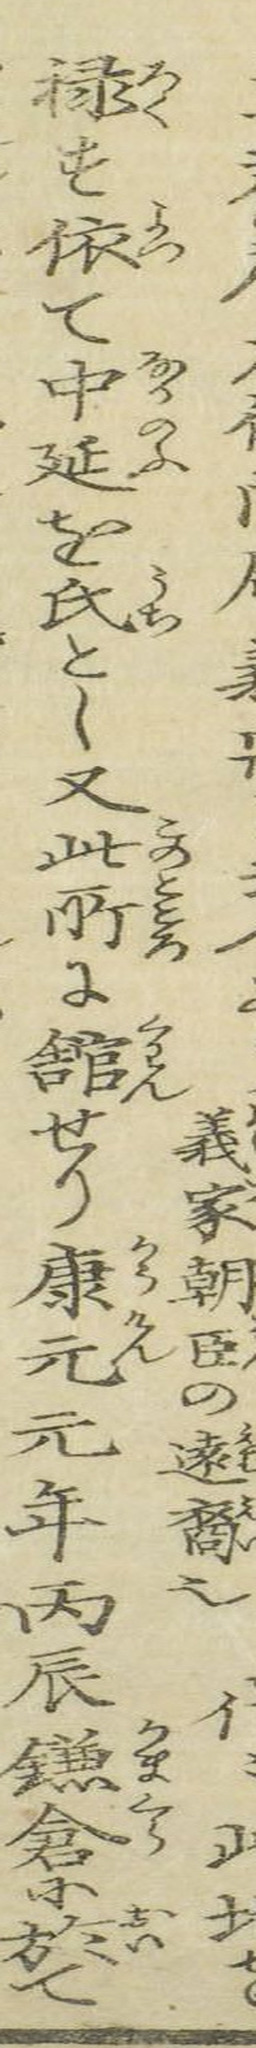禄す依て中延を氏とし又此所に舘せり康元元年丙辰鎌倉に於て
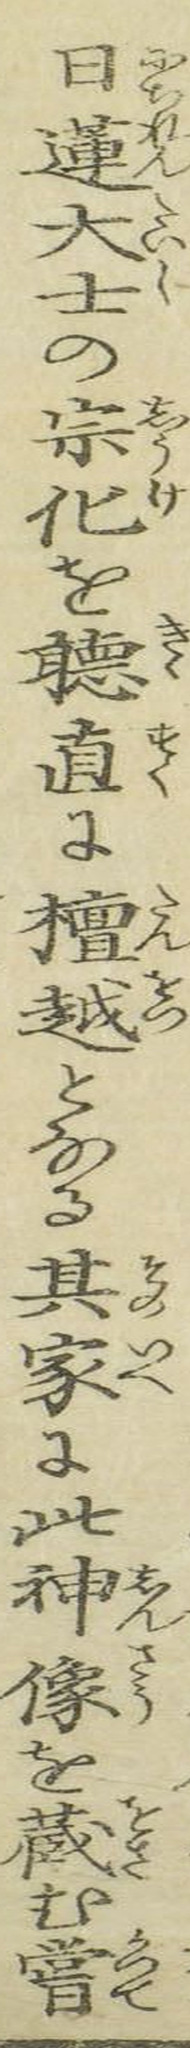日蓮大士の宗化を聽直に檀越となる其家に此神像を藏む嘗
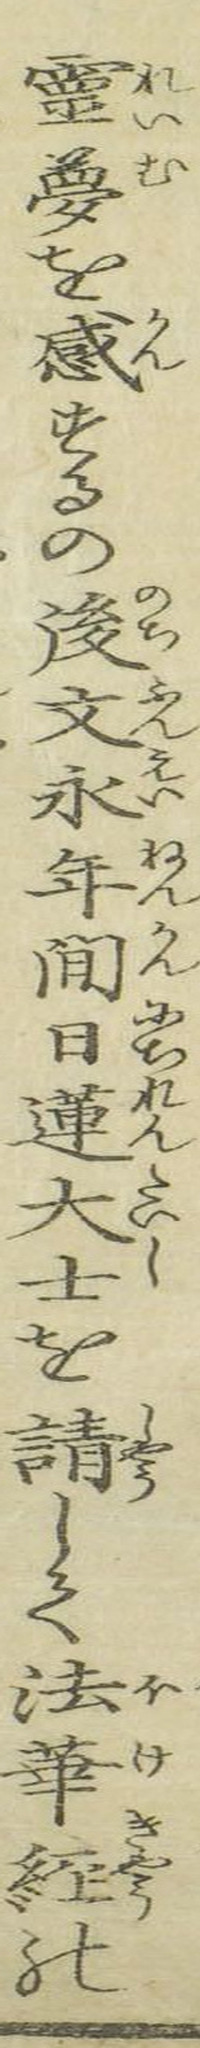靈夢を感するの後文永年間日蓮大士を請して法華經の
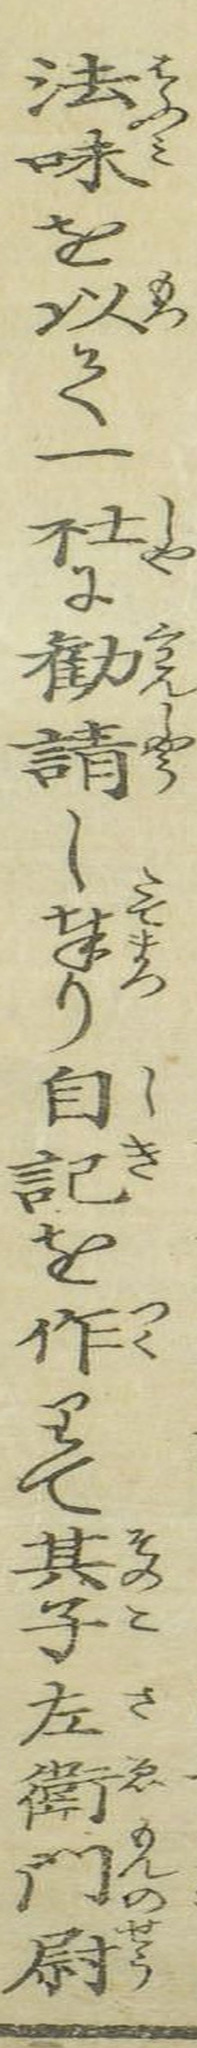法味を以て一社に勧請し奉り自記を作りて其子左衛門尉

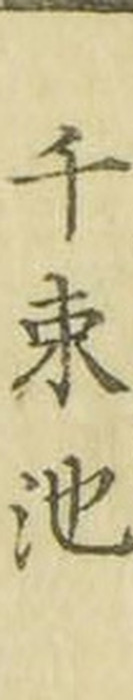千束池
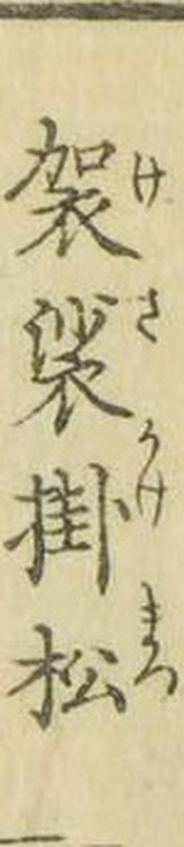袈裟掛松

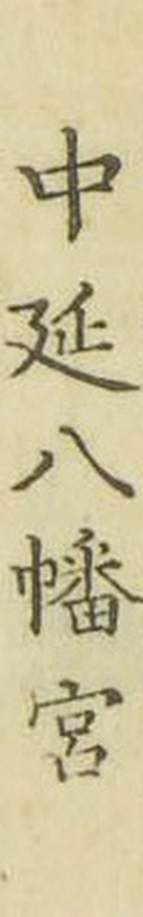中延八幡宮
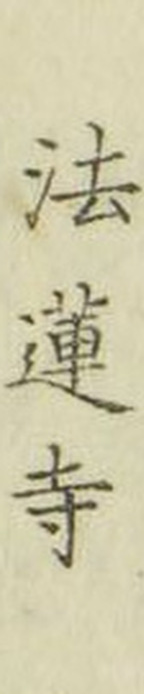法蓮寺

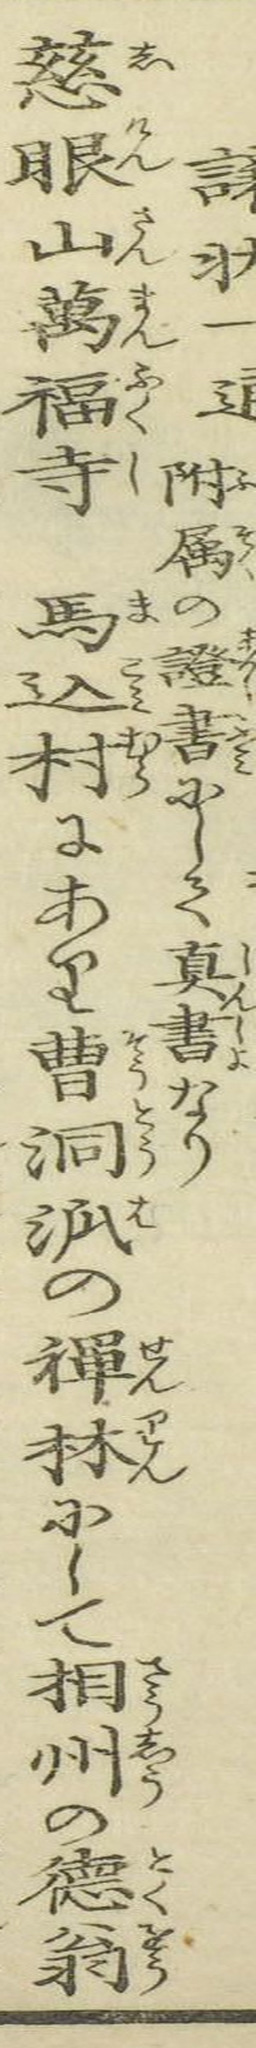慈眼山萬福寺馬込村にあり曹洞派の禪林にして相州の德翁
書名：江戸名所図会 20巻 巻之4
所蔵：東京学芸大学教育コンテンツアーカイブ
